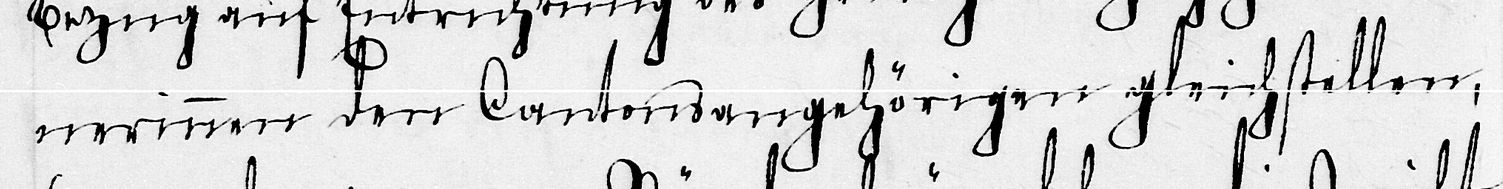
nerinnen den Cantonsangehörigen gleichstellen,
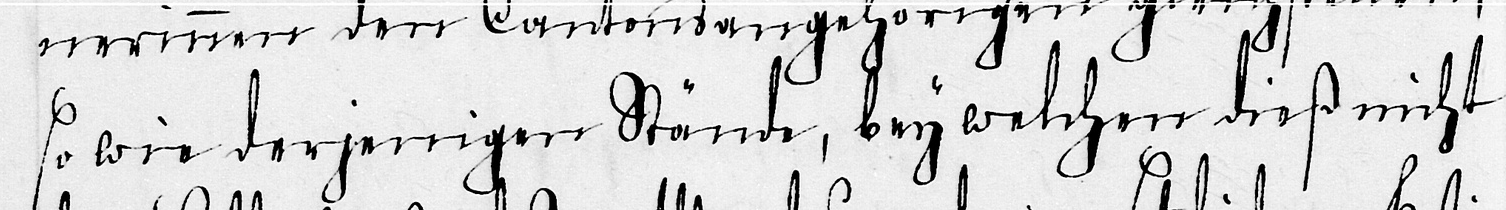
so wie derjenigen Stände, bey welchen dieß nicht
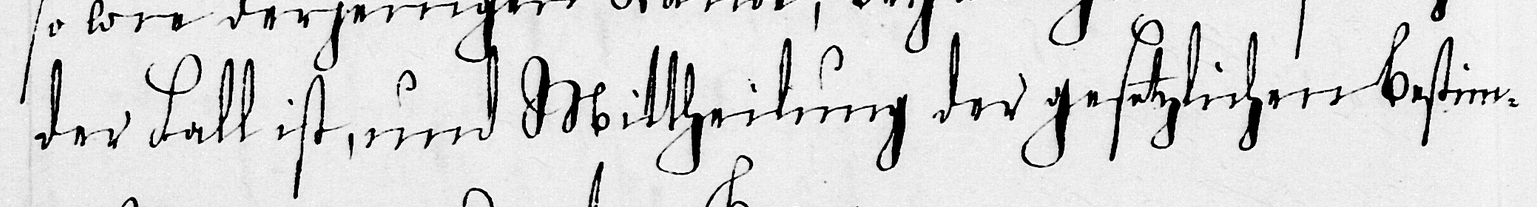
der Fall ist, und Mittheilung der gesetzlichen Bestim¬
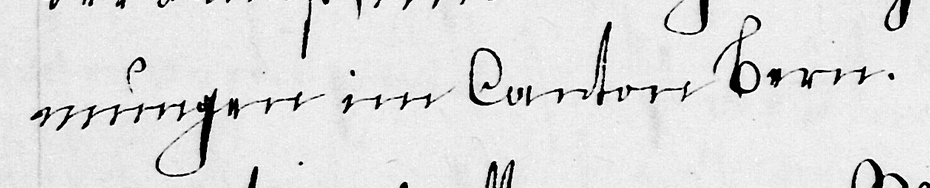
mungen im Canton Bern.
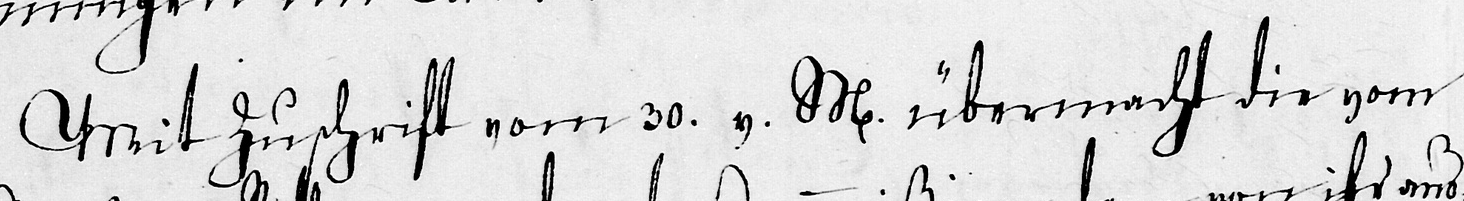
Mit Zuschrift vom 30. v. M. übermacht die vom
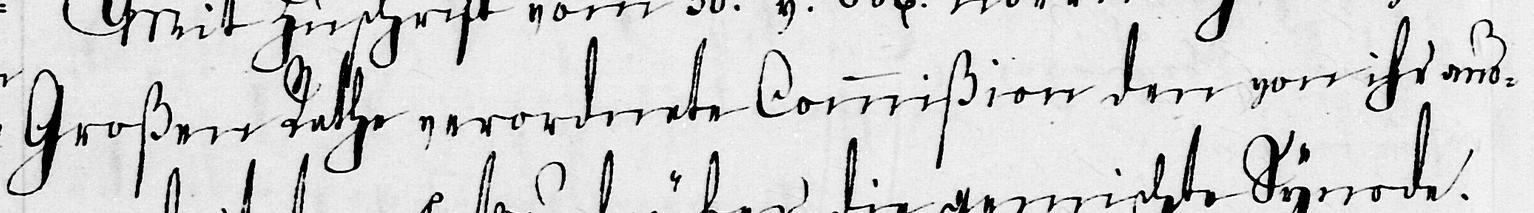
Großen Rathe verordnete Commißion den von ihr aus¬
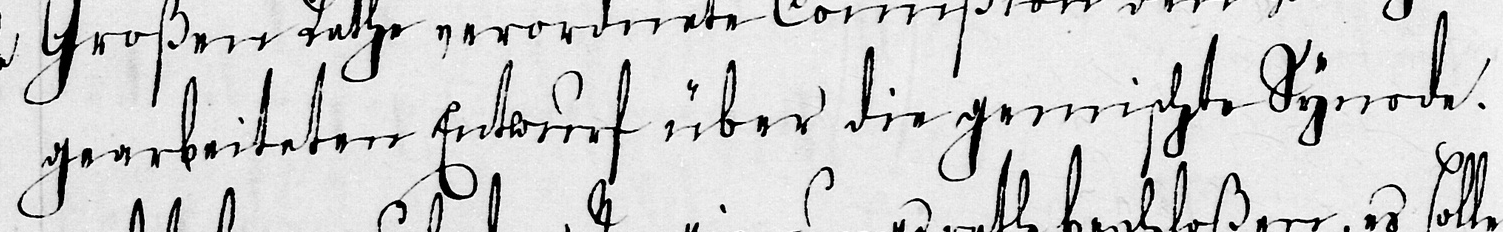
gearbeiteten Entwurf über die gemischte Synode.
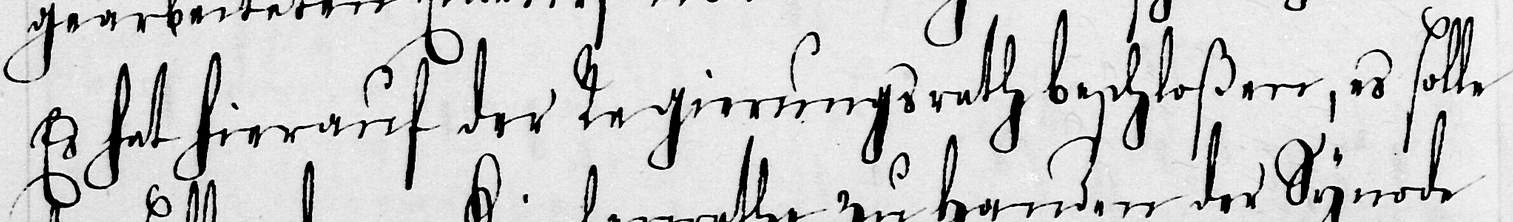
Es hat hierauf der Regierungsrath beschloßen, es sol¬
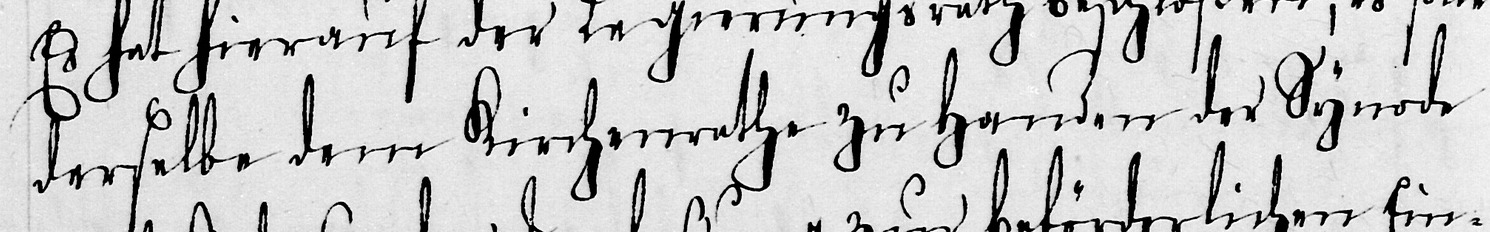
derselbe dem Kirchenrathe zu Handen der Synode
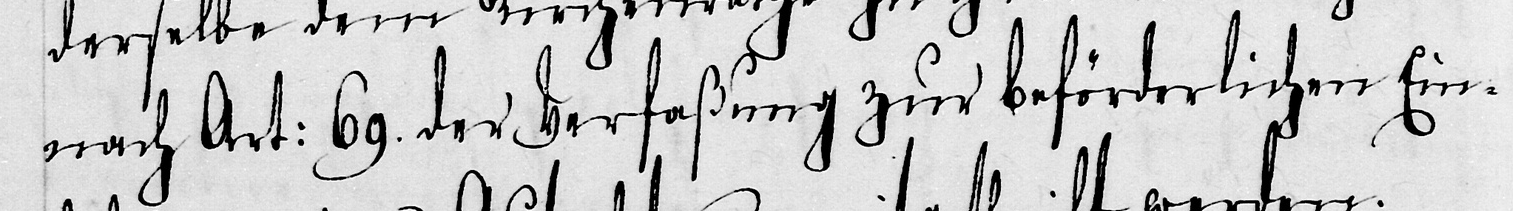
nach Art: 69. der Verfaßung zur beförderlichen Ein¬
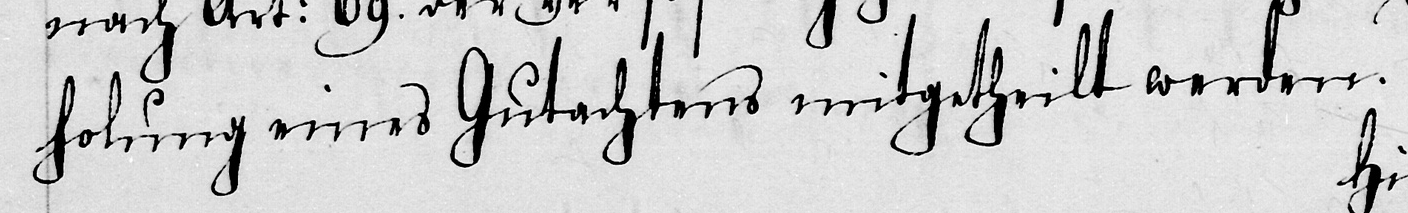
holung eines Gutachtens mitgetheilt werden.
